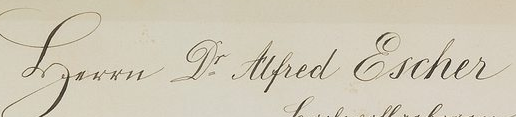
Herrn Dr Alfred Escher
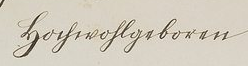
Hochwohlgeboren
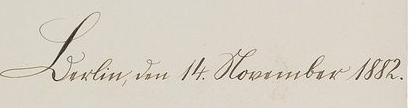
Berlin, den 14. November 1882.
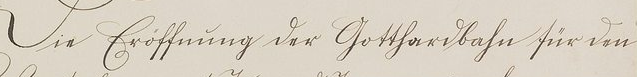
Die Eröffnung der Gotthardbahn für den
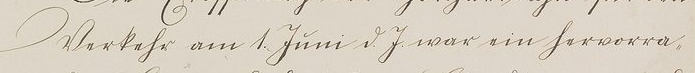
Verkehr am 1. Juni d. J. war ein hervorra-
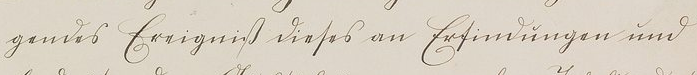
gendes Ereigniß dieses an Erfindungen und
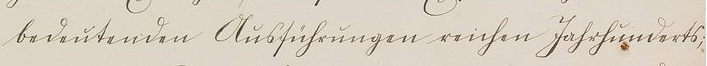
bedeutenden Ausführungen reichen Jahrhunderts;
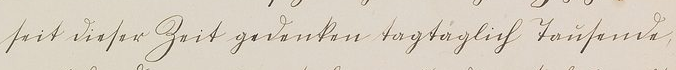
seit dieser Zeit gedenken tagtäglich Tausende,
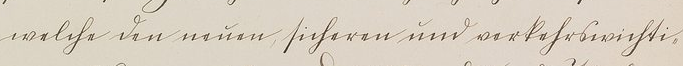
welche den neuen, sicheren und verkehrswichti-
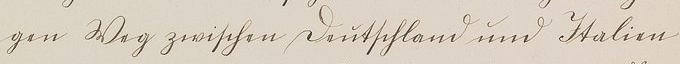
gen Weg zwischen Deutschland und Italien
